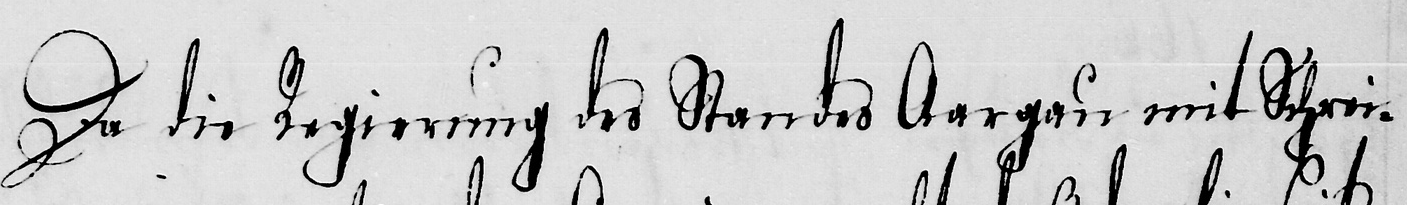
Da die Regierung des Standes Aargau mit Schreib¬
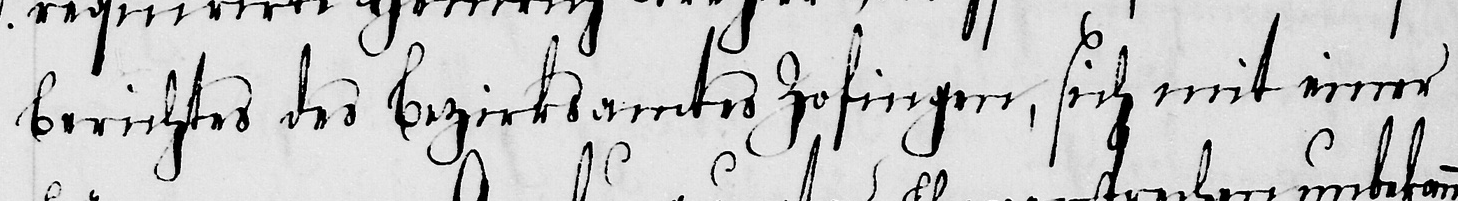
Berichtes des Bezirksamtes Zofingen, sich mit einer
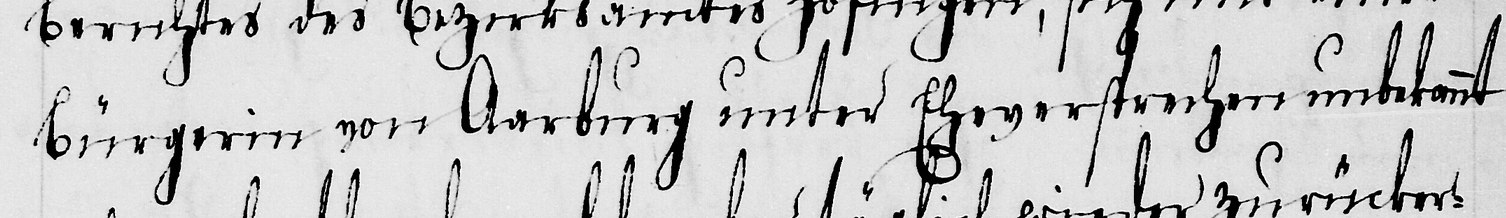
Bürgerin von Aarburg unter Eheversprechen unbekannt
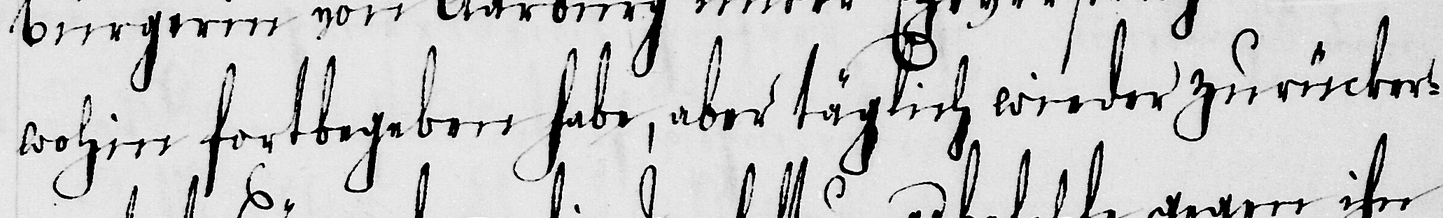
wohin fortbegeben habe, aber täglich wieder zurücker¬
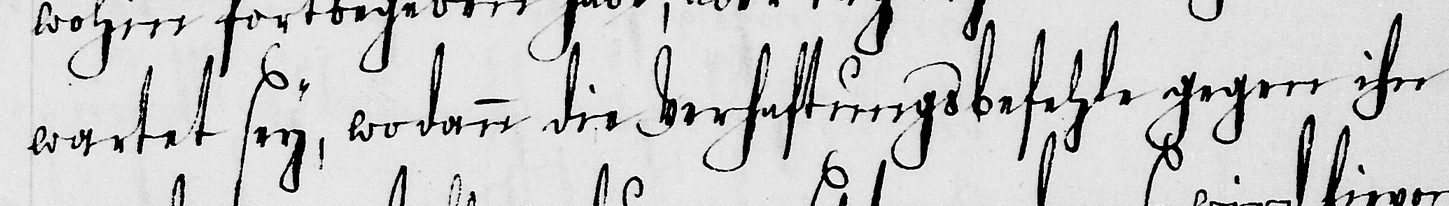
wartet sey, wodann die Verhaftungsbefehle gegen ihn
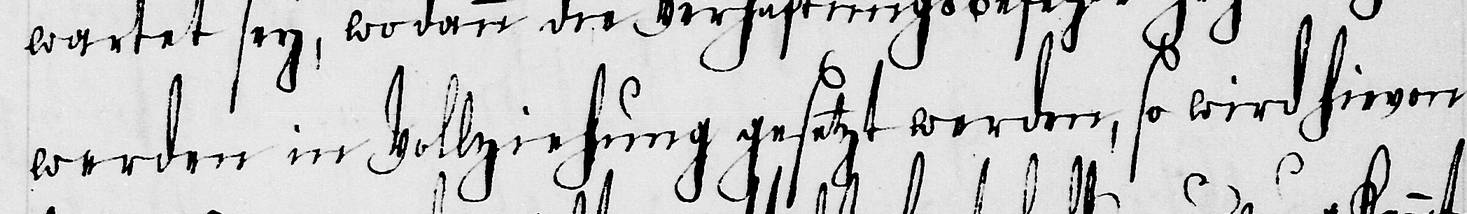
werden in Vollziehung gesetzt werden, so wird hievon
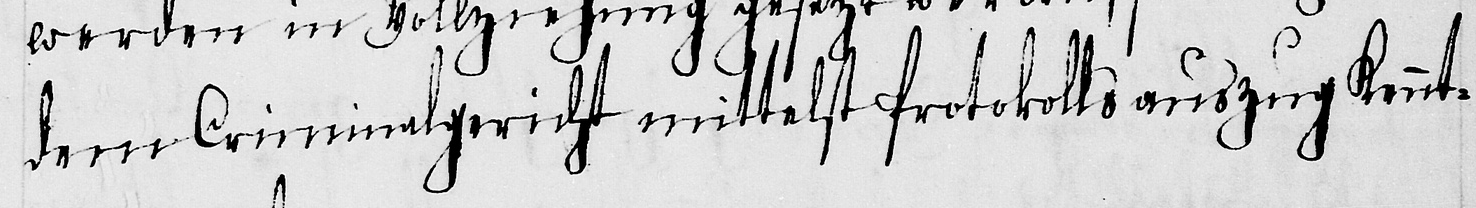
dem Criminalgericht mittelst Protokollsauszug Kennt¬
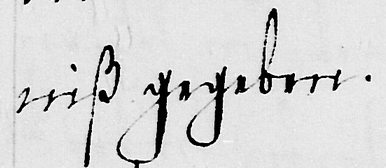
niß gegeben.
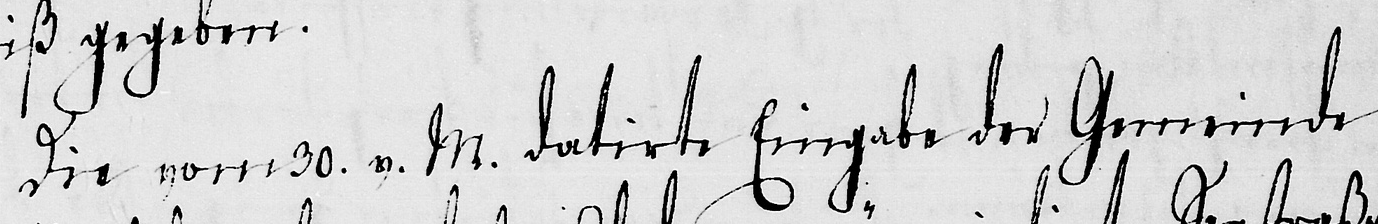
Die vom 30. v. M. datirte Eingabe der Gemeinde
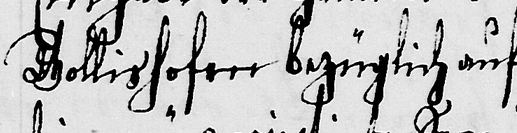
Wollishofen bezüglich auf
